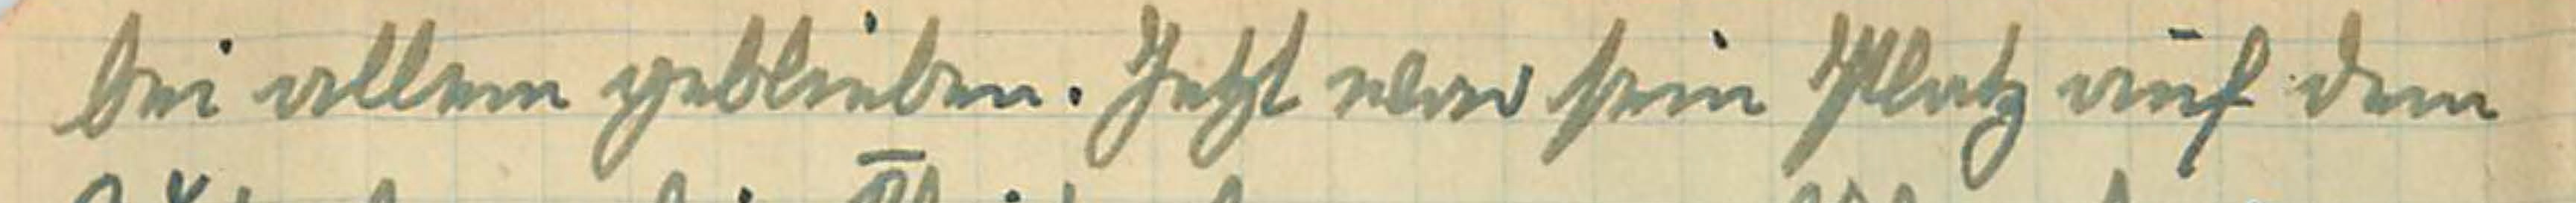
bei allem geblieben. Jetzt war sein Platz auf dem
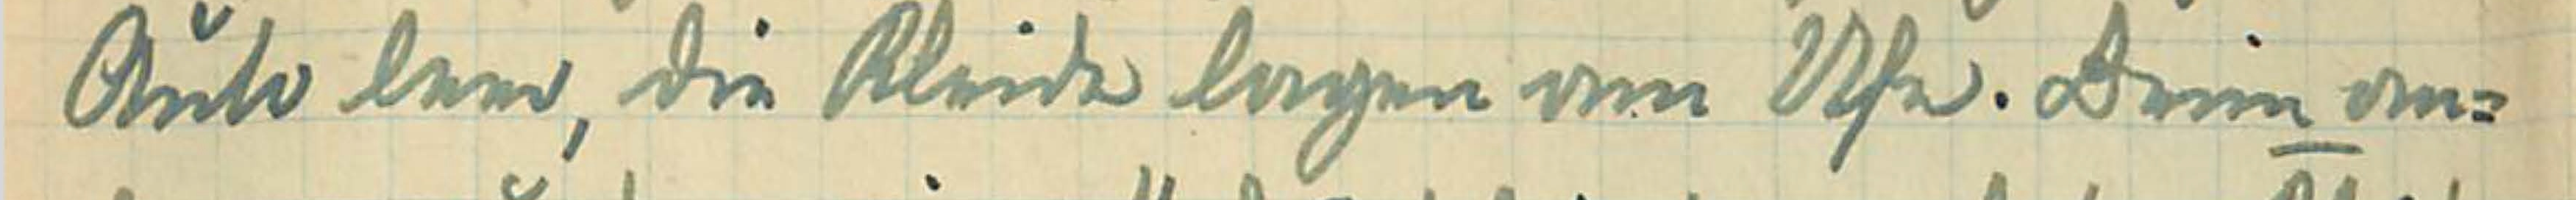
Auto leer, die Kleider lagen am Ufer. Beim an-
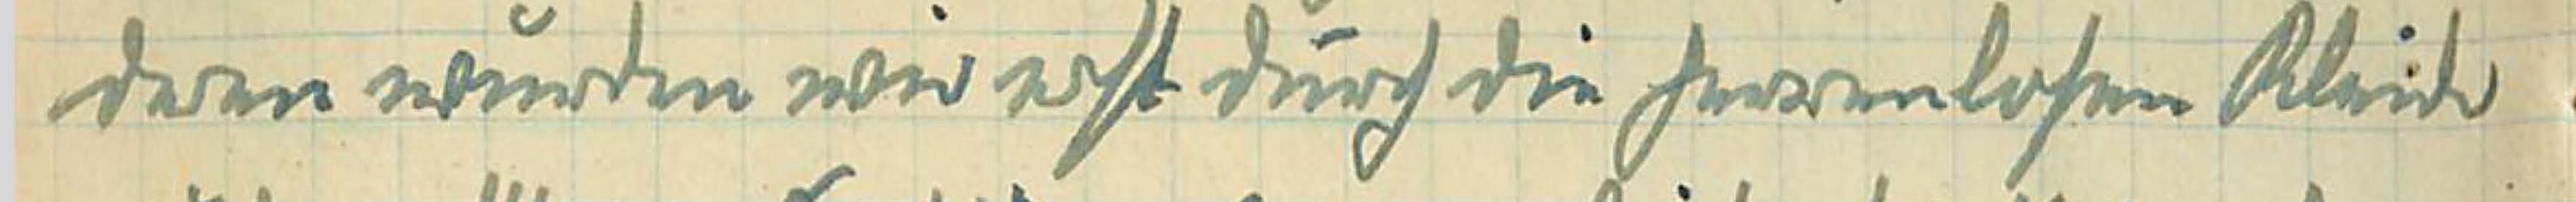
deren wurden wir erst durch die herrenlosen Kleider
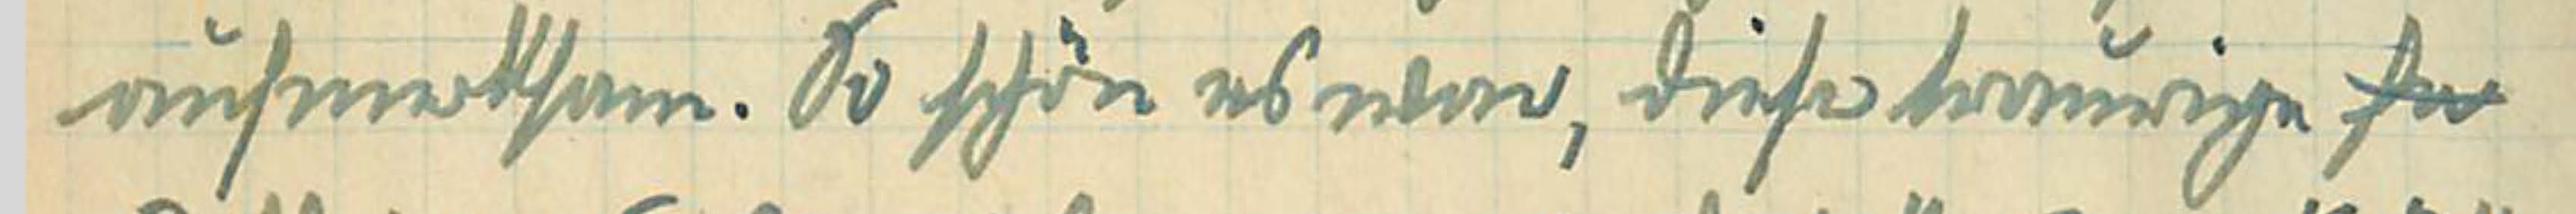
aufmerksam. So schön es war, dieser traurige fa
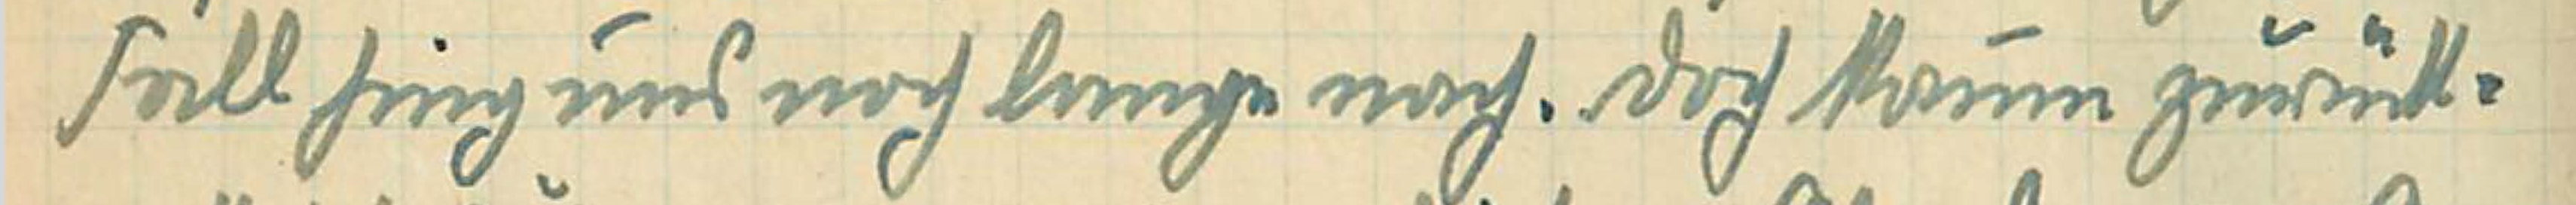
Fall hing uns noch lange nach. Doch kaum zurück-
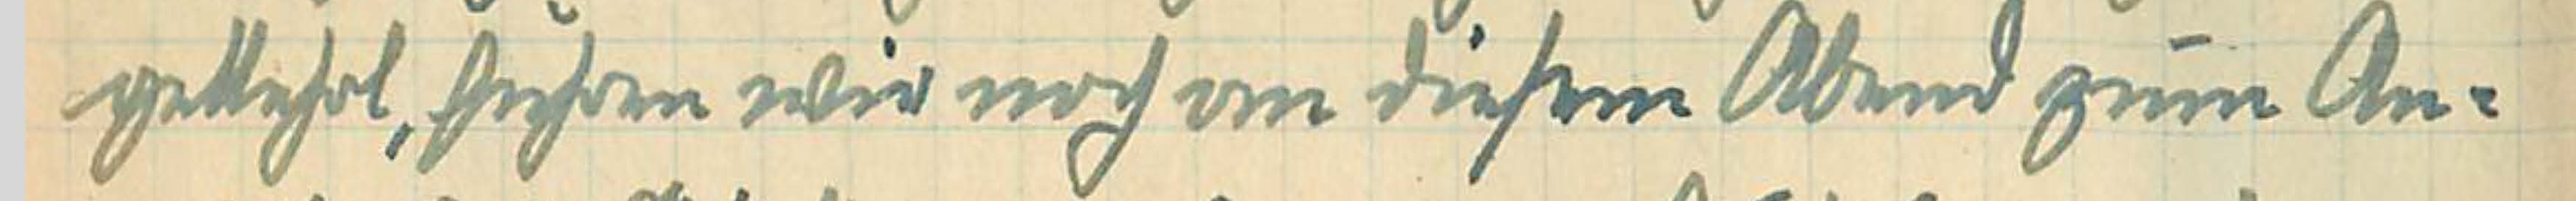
gekehrt, fuhren wir noch an diesem Abend zum An-
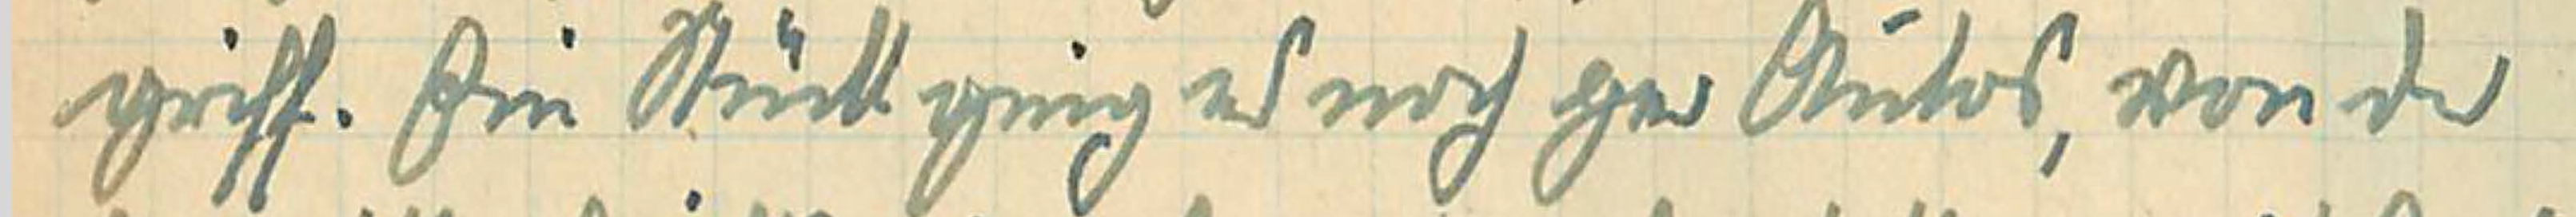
griff. Ein Stück ging es noch per Autos, von der
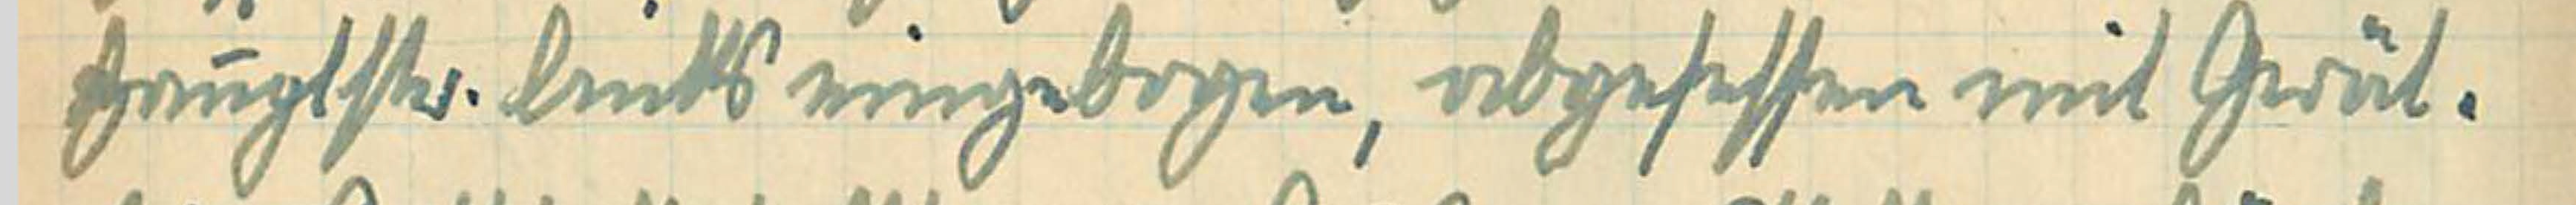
Hauptstr. links eingebogen, abgesessen mit Gerät.
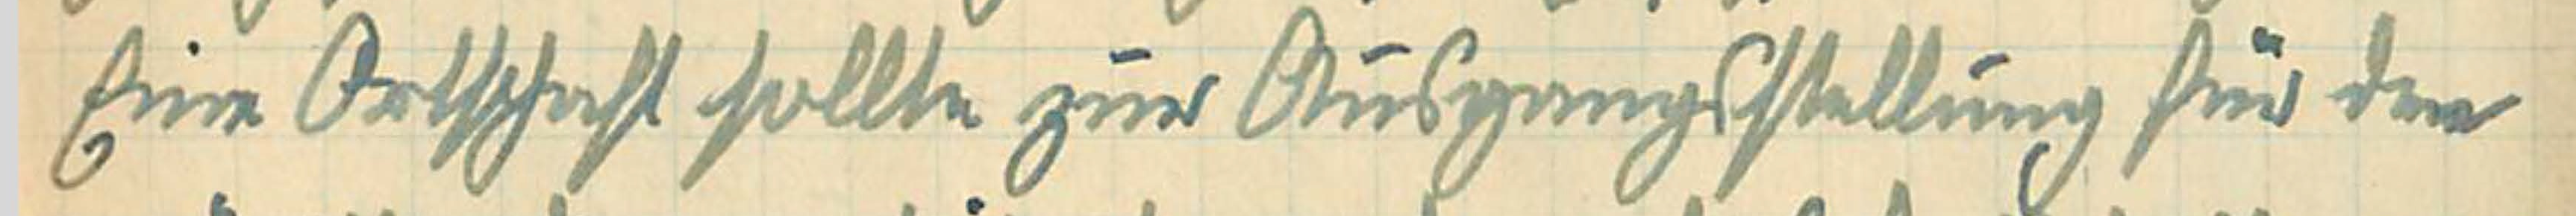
Eine Ortschaft sollte zur Ausgangsstellung für den
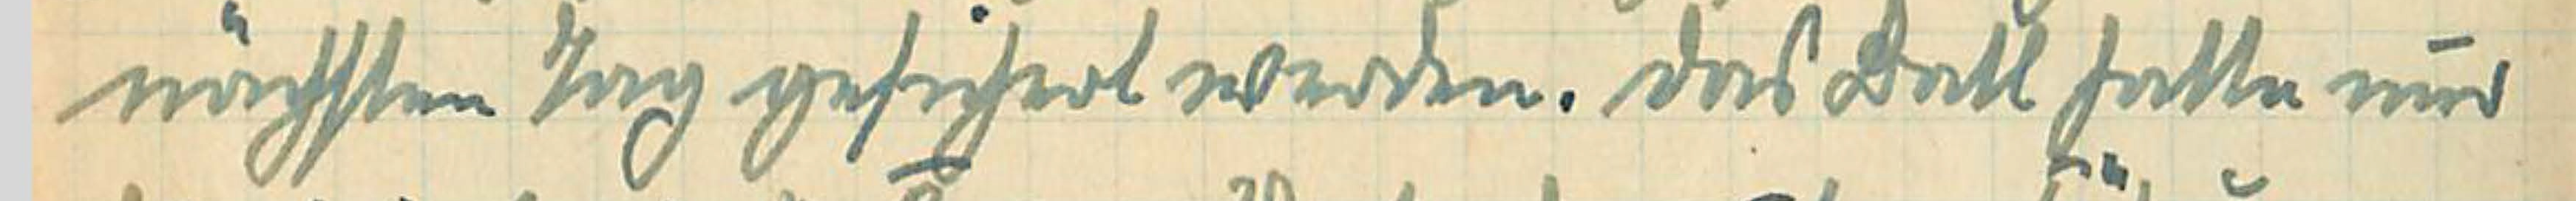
nächsten Tag gesichert werden. Das Batl hatte nur
